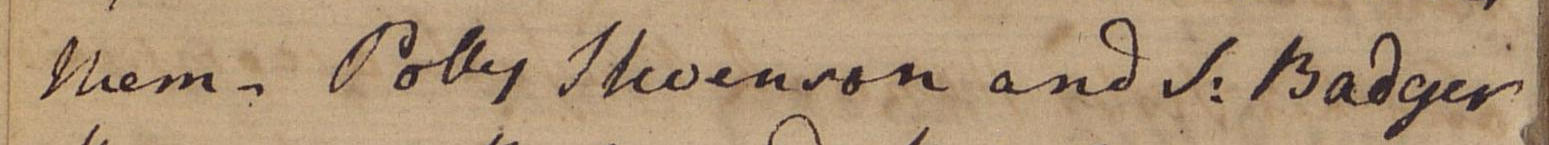them. Polly Stevenson and S: Badger
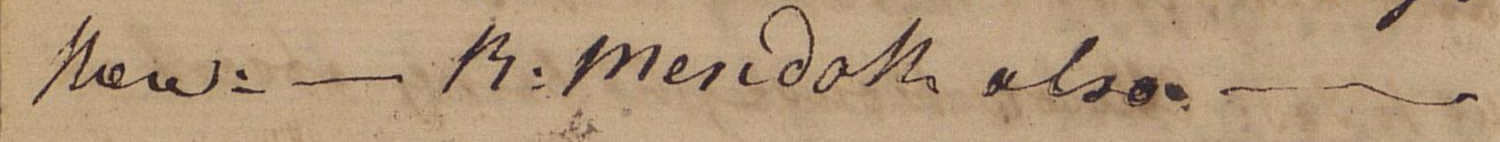there:- R. Mendoth also-
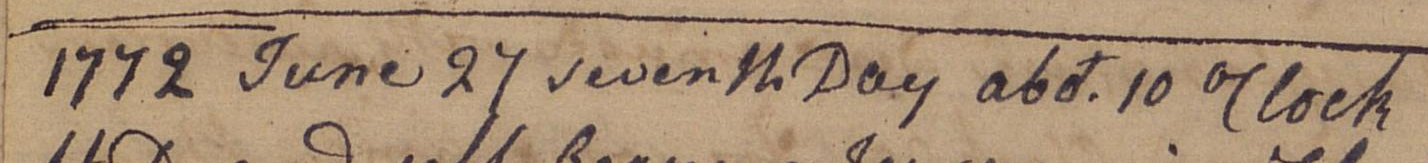1772 June 27 seventh Day abo^t. 10 oClock
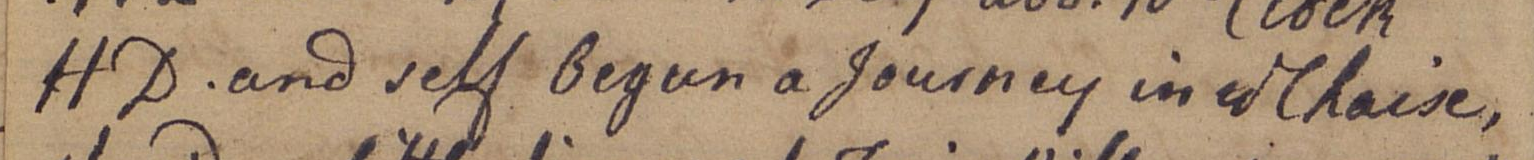HD. and self begun a Journey in y^e Chaise,
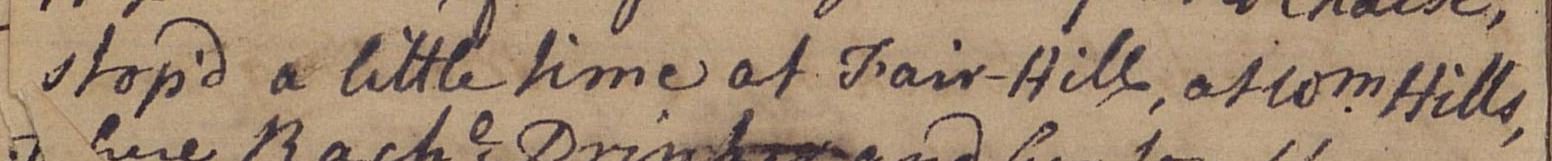stop'd a little time at Fair-Hill, at W^m Hills,
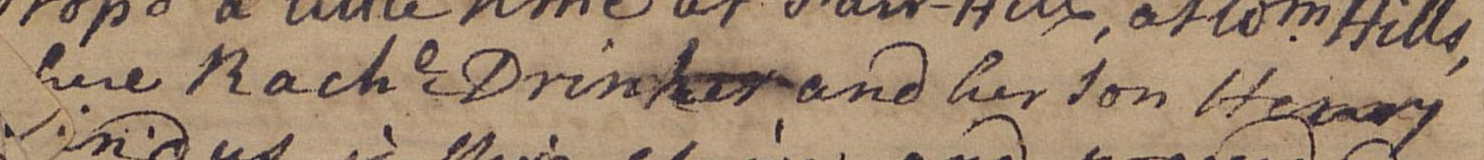here Rach^l Drinker and her son Henry
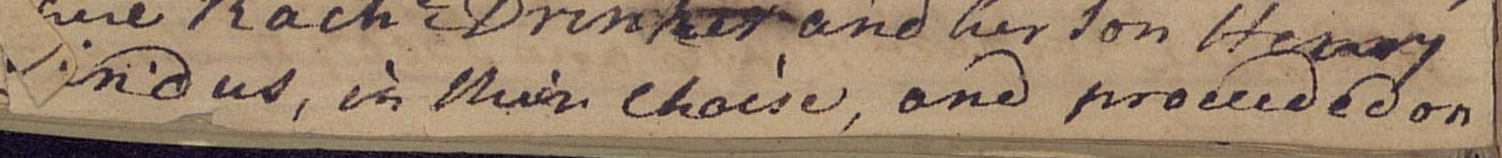[i]ndus, in their chaise, and proceeded on
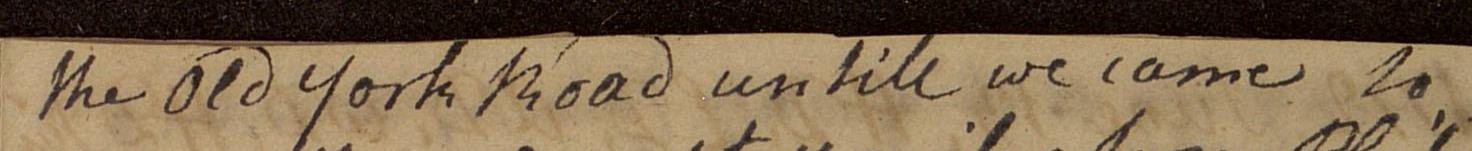the Old York Road untill we came to
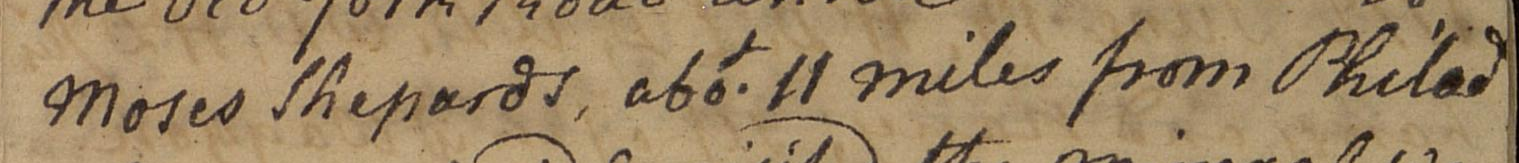Moses Shepards, abo^t. 11 miles from Philad
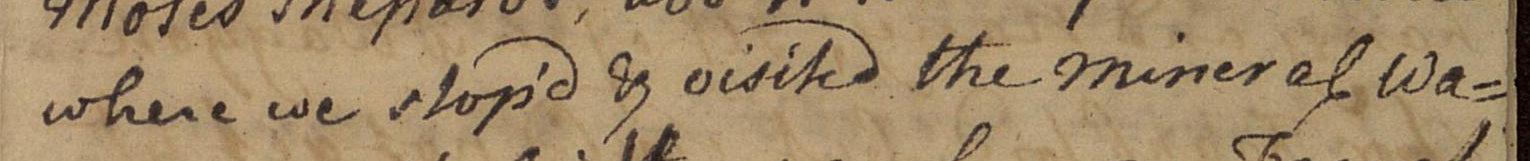where we stop'd & visited the mineral wa-
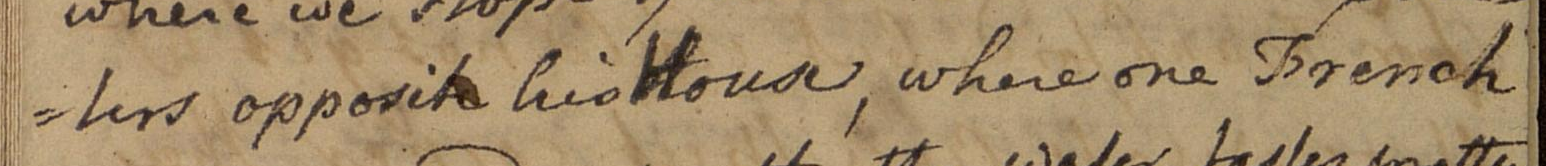-ters opposite his House, where one French
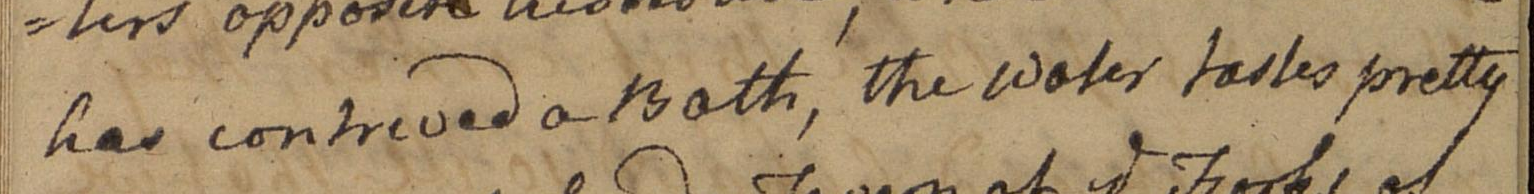has contrived a Bath, the water tastes pretty
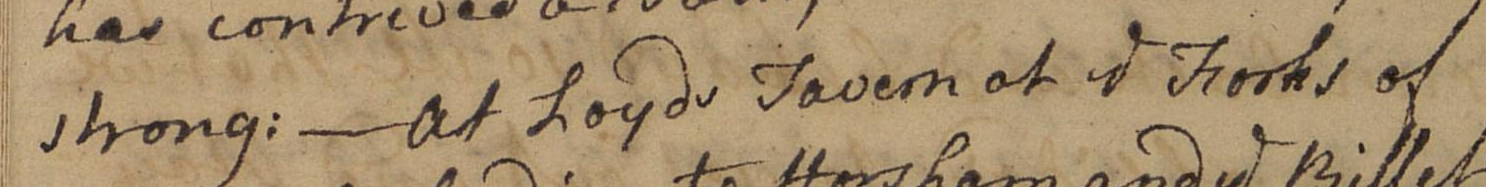strong:- at Loyds Tavern at y^e Forks of
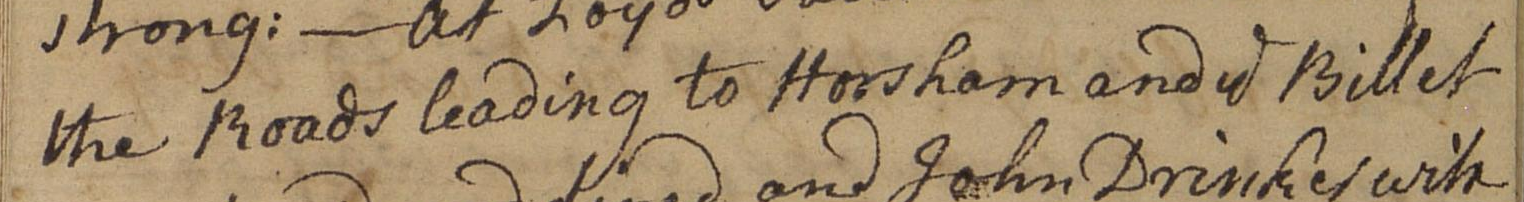the Roads leading to Horsham and y^e Billet
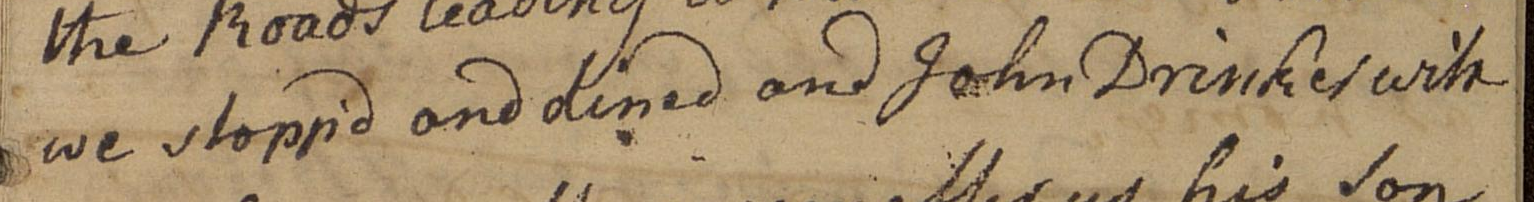we stopp'd and dined and John Drinker wih
